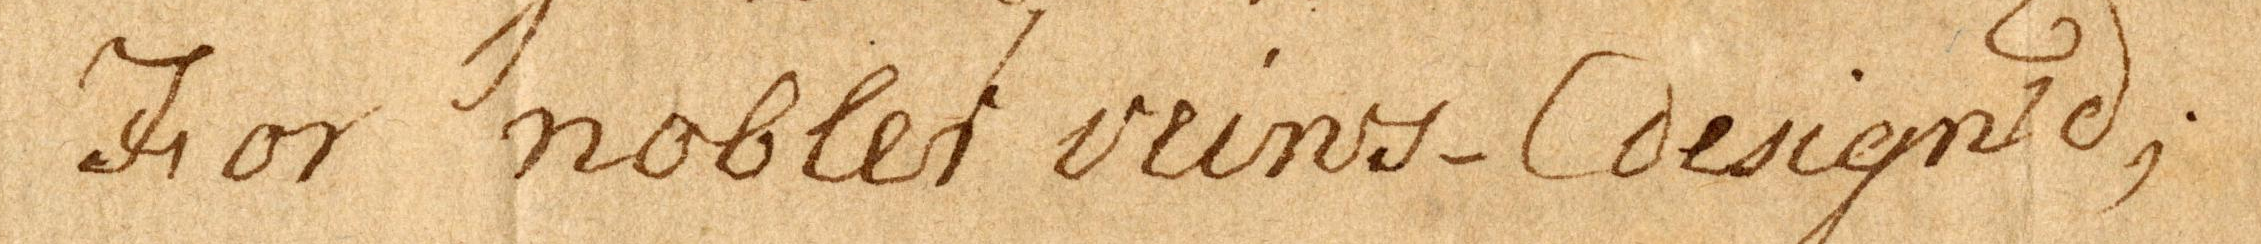For nobler veins- Consign'd;
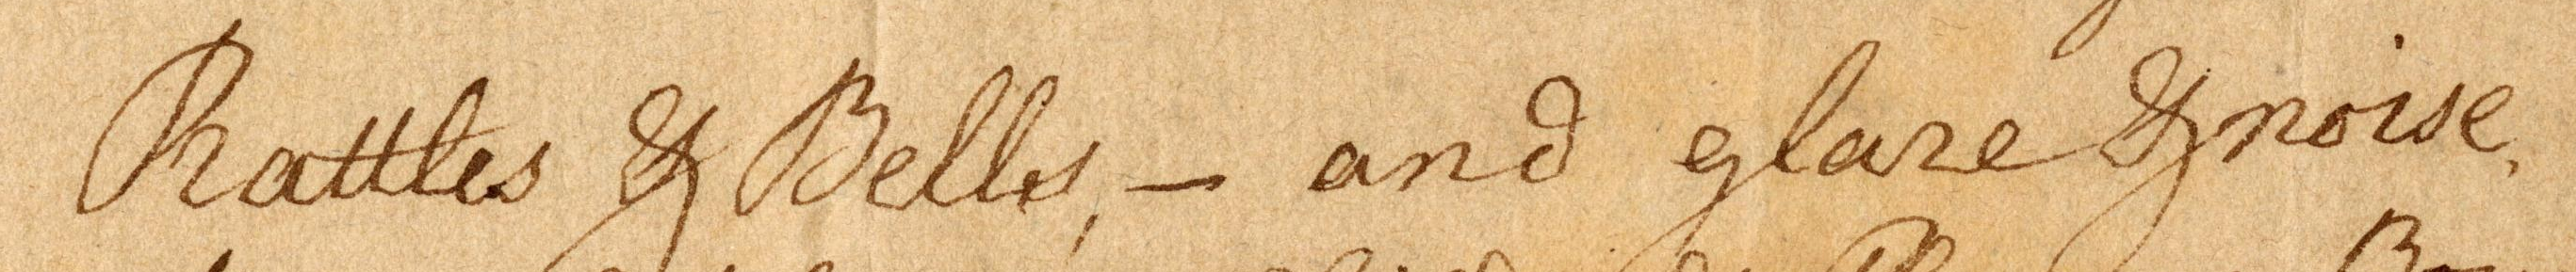Rattles & Bells,- and glare & noise,
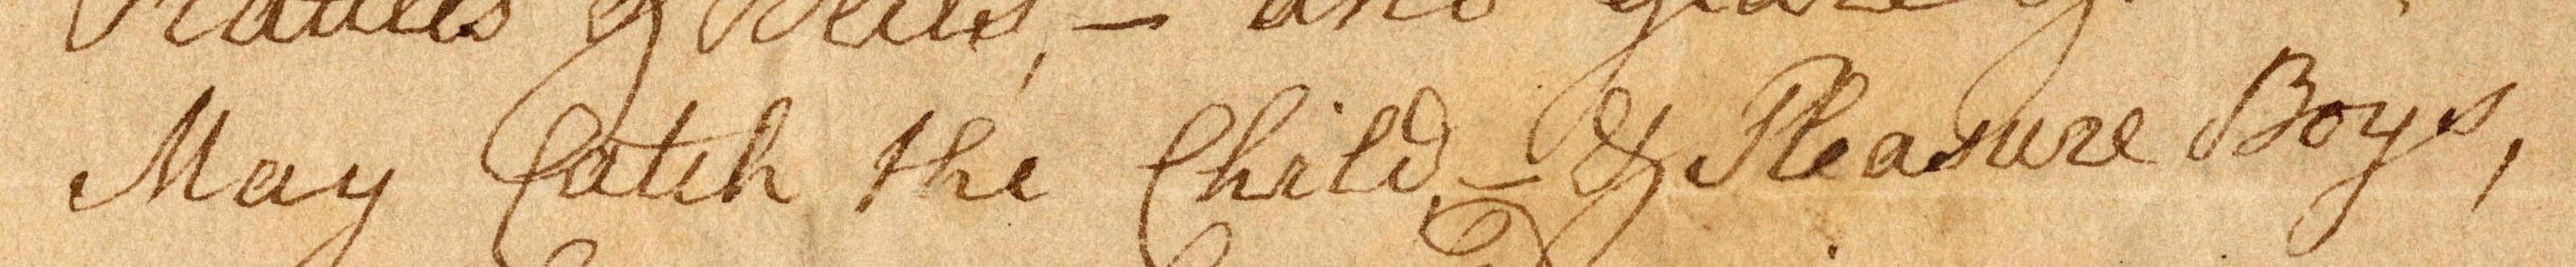May Catch the Child- & Pleasure Boys,
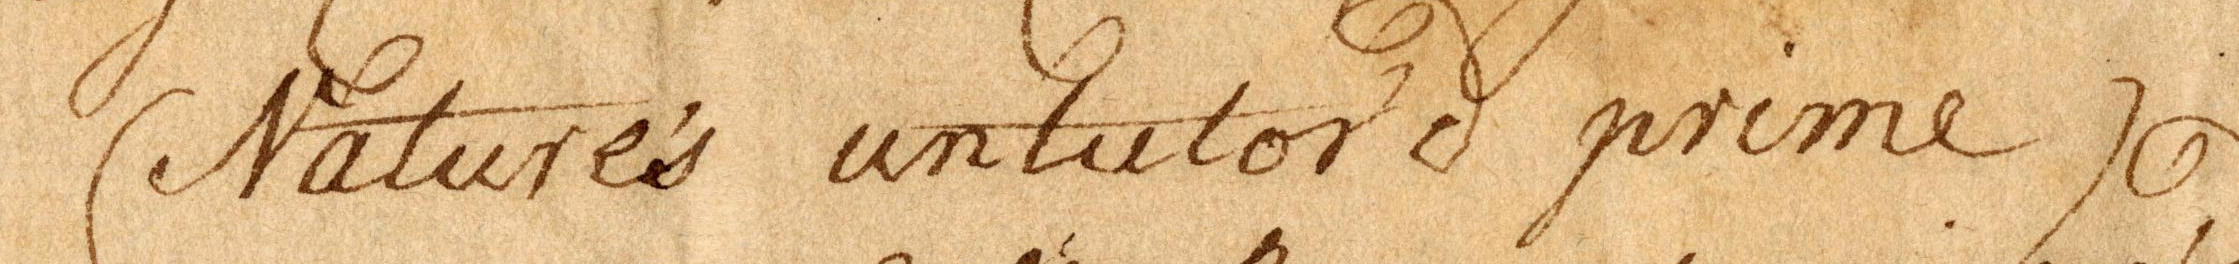(Nature's untutor'd prime)
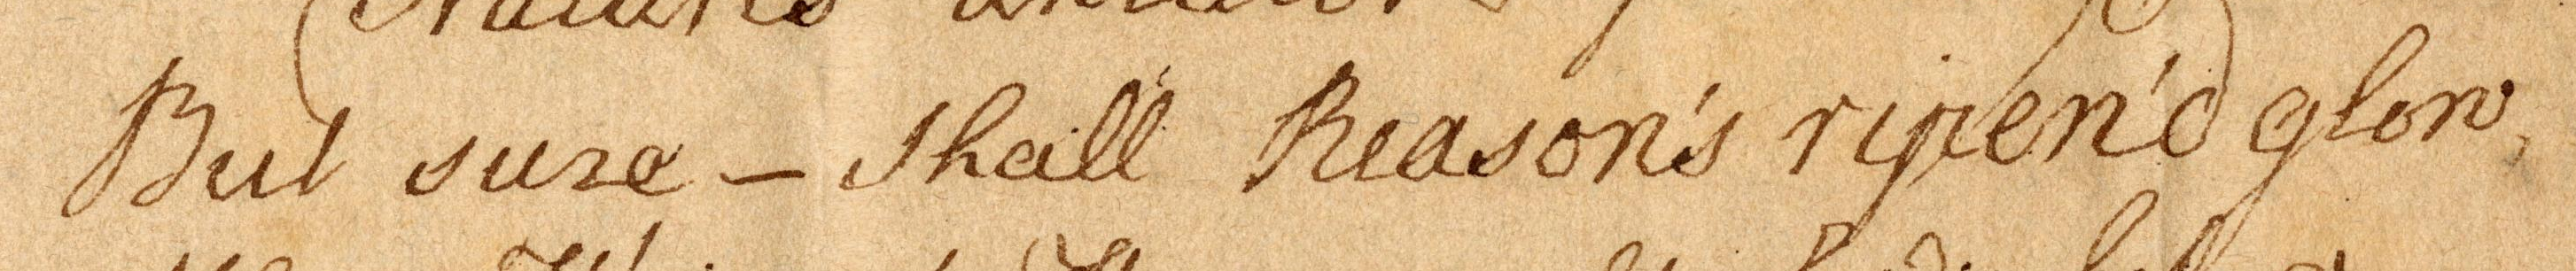But sure- shall Reason's ripen'd glow,
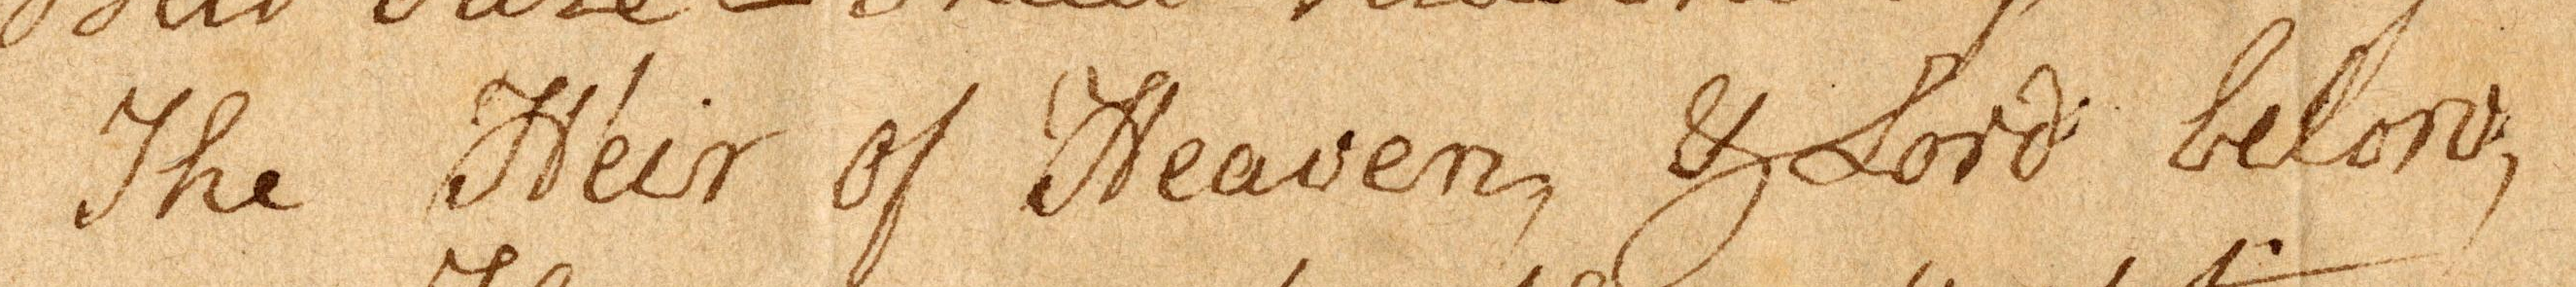The Heir of Heaven, & Lord below,
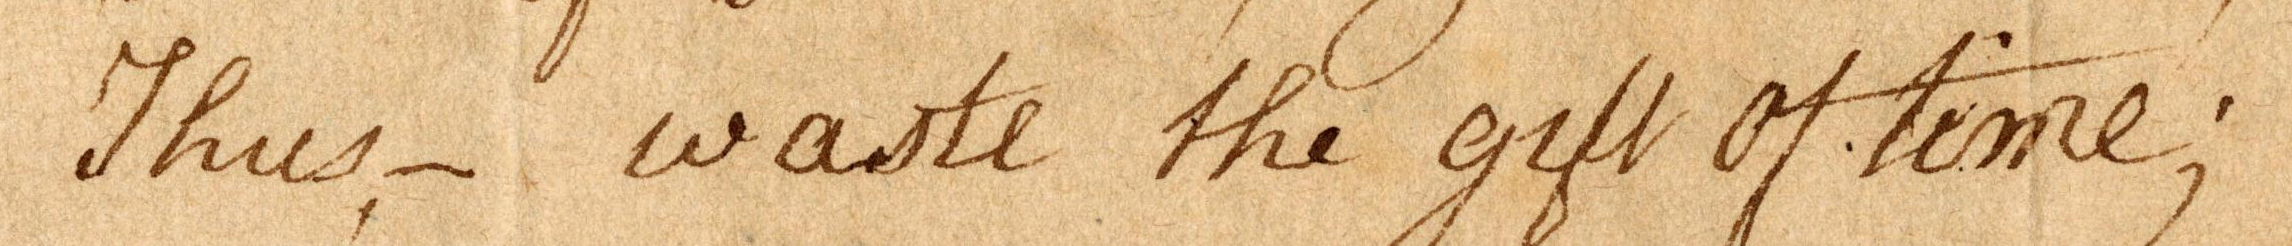Thus- waste the gift of time;
